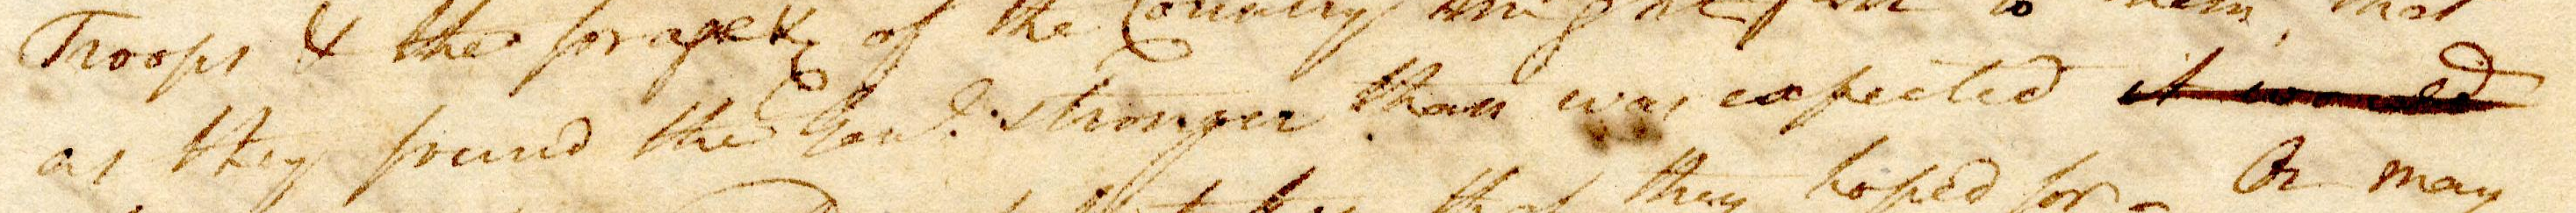as they found the Gen^l. stronger than was expected it would
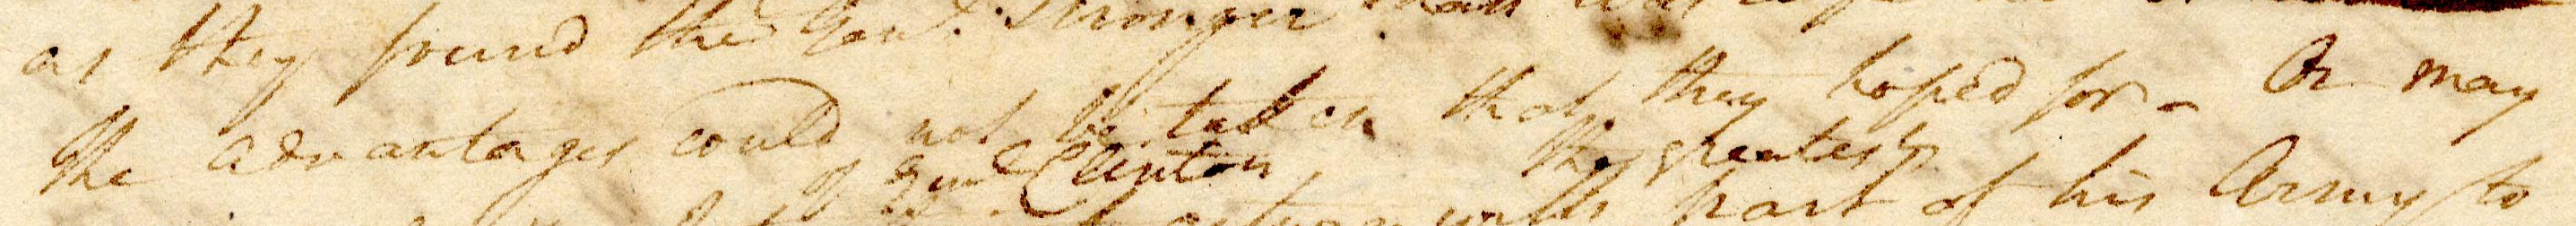the Advantages could not be taken that they hoped for. Or may
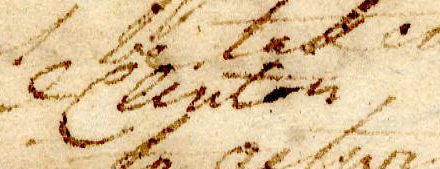Clinton
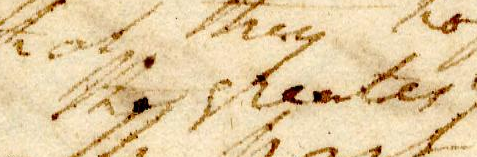the greatest
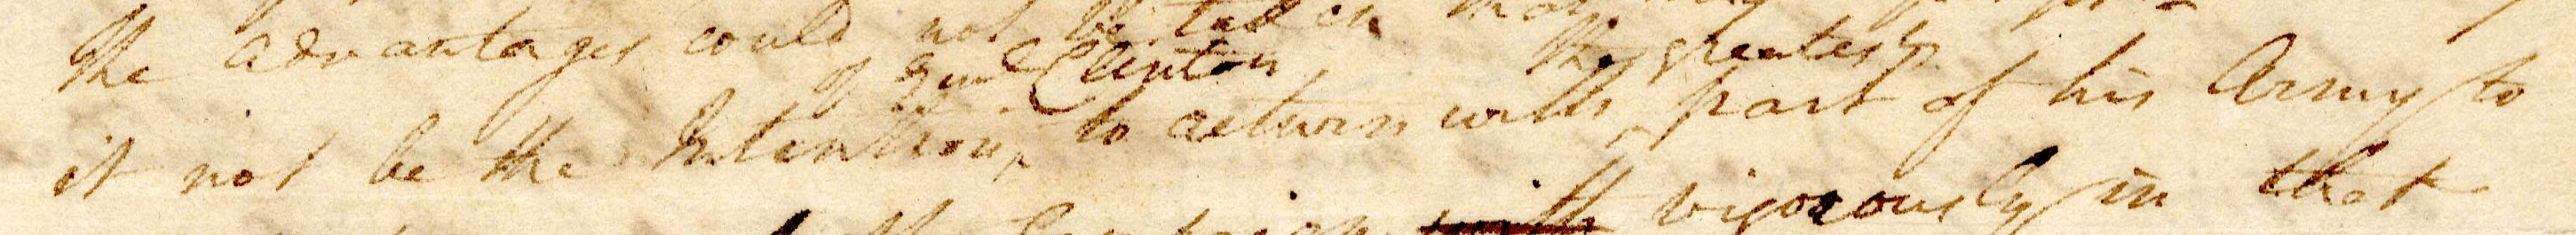it not be the Intention ^ to return with ^ part of his Army to
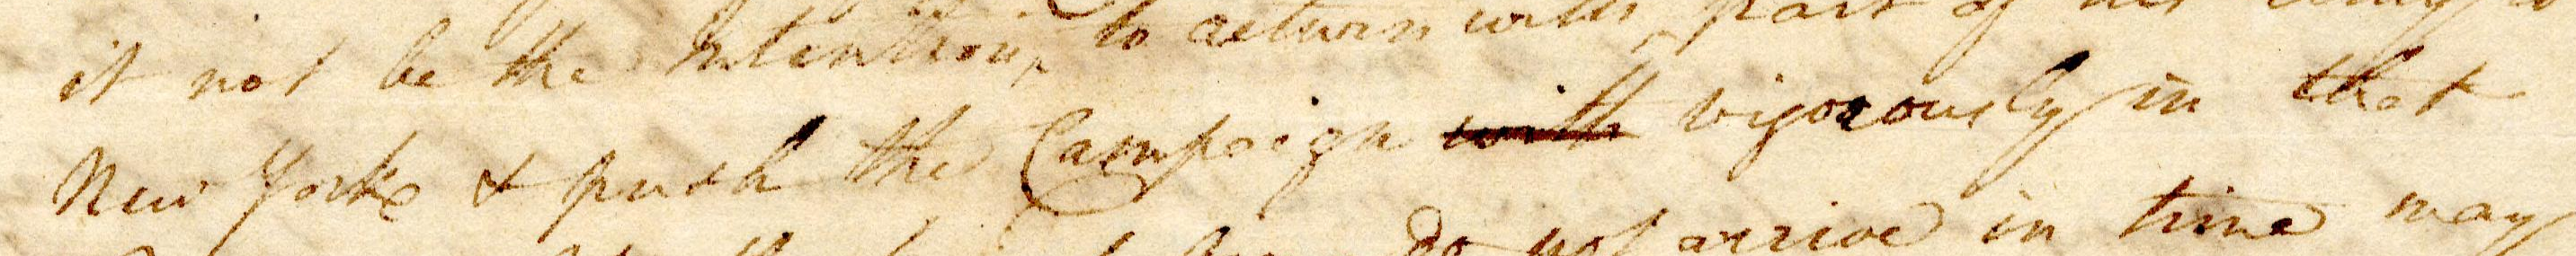New York & push the Campaign with vigorously in that
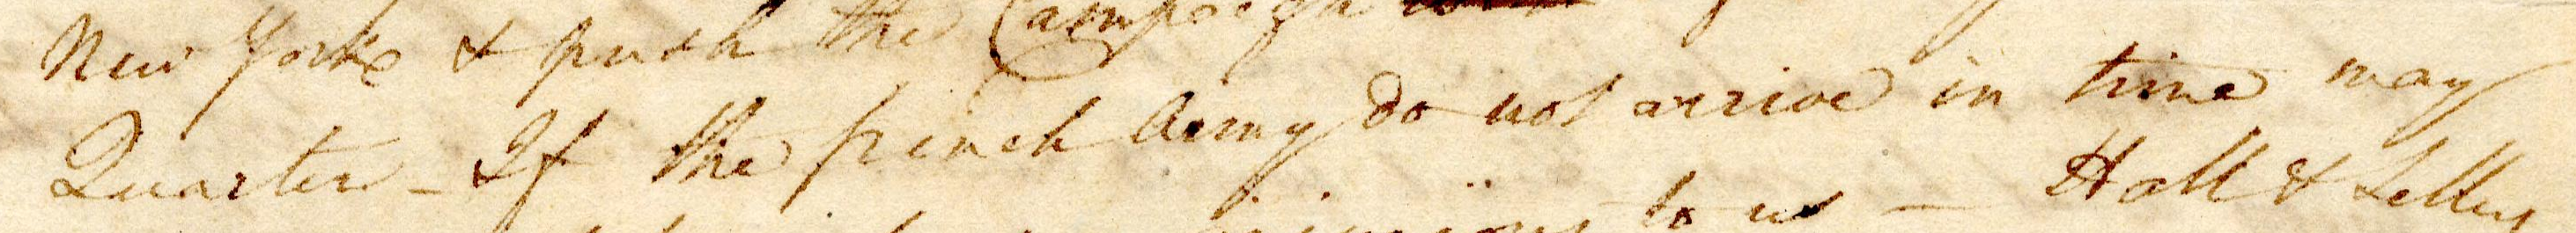Quarter. If the French Army do not arrive in time may
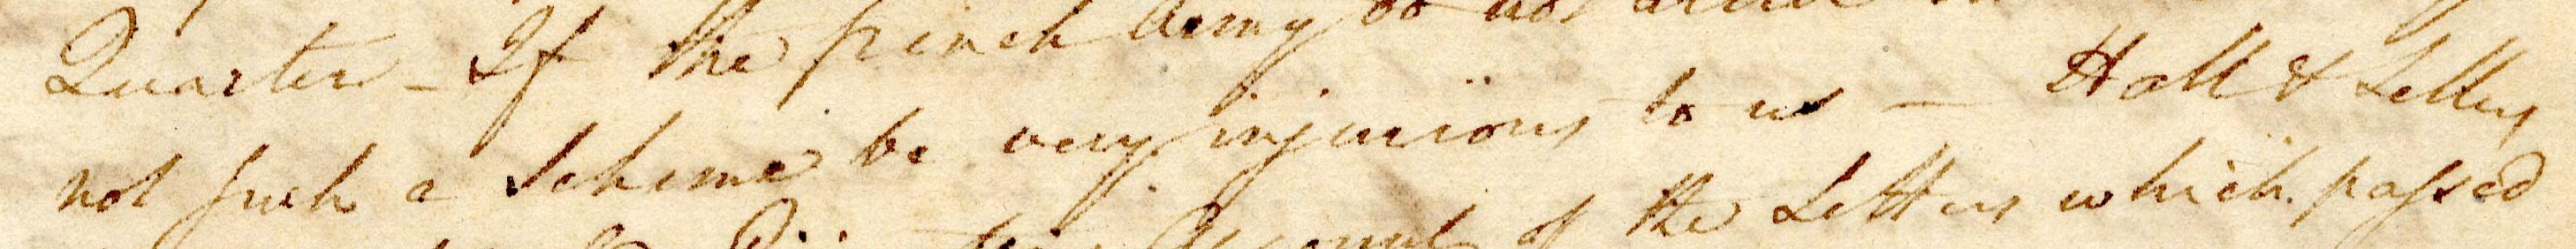not such a Scheme be very injurious to us. Hall & Letters
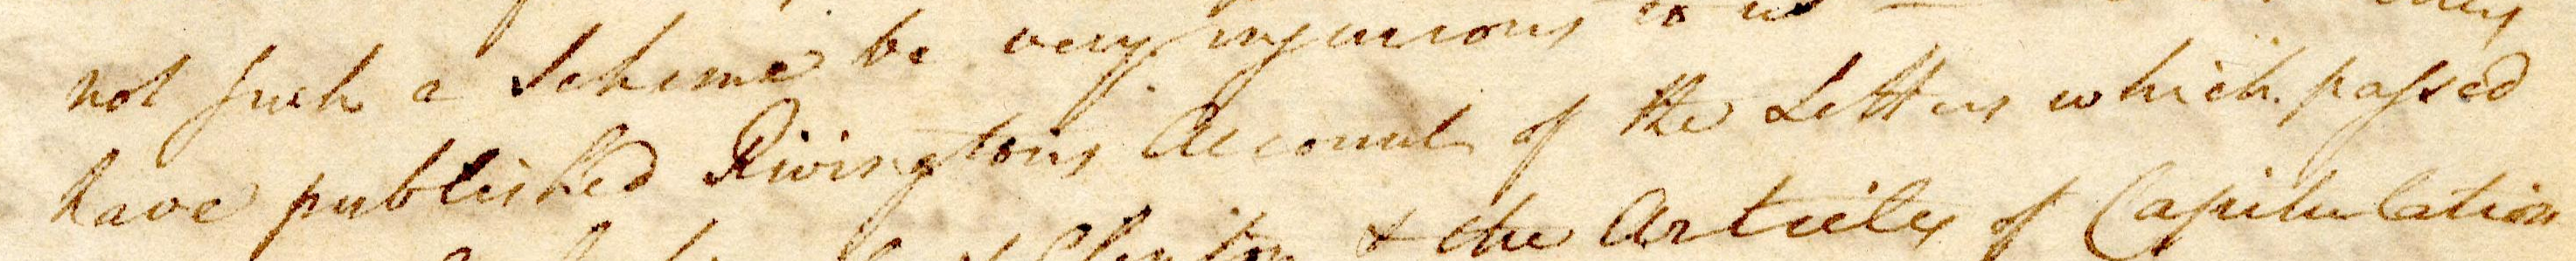have published Rivingtons Account of the Letters which passed
